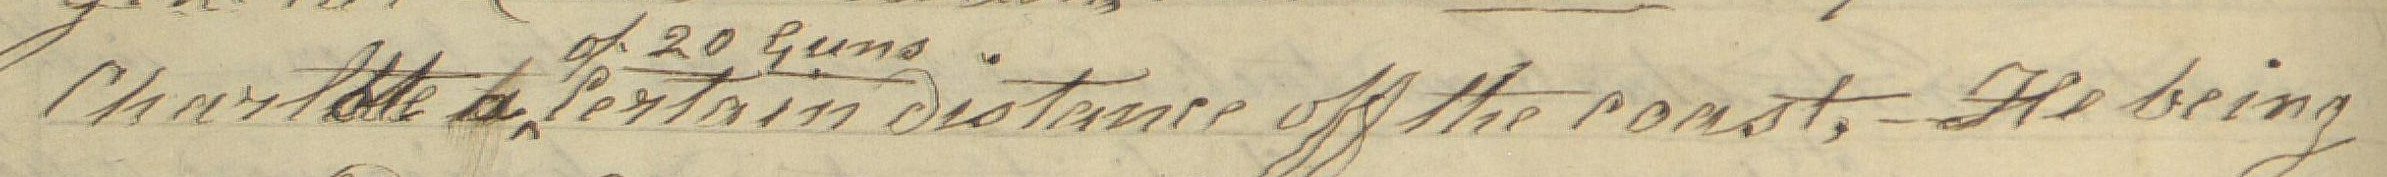Charlotte a ^ Certain distance off the coast, He being
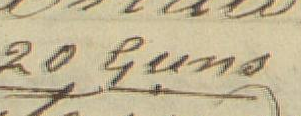20 Guns
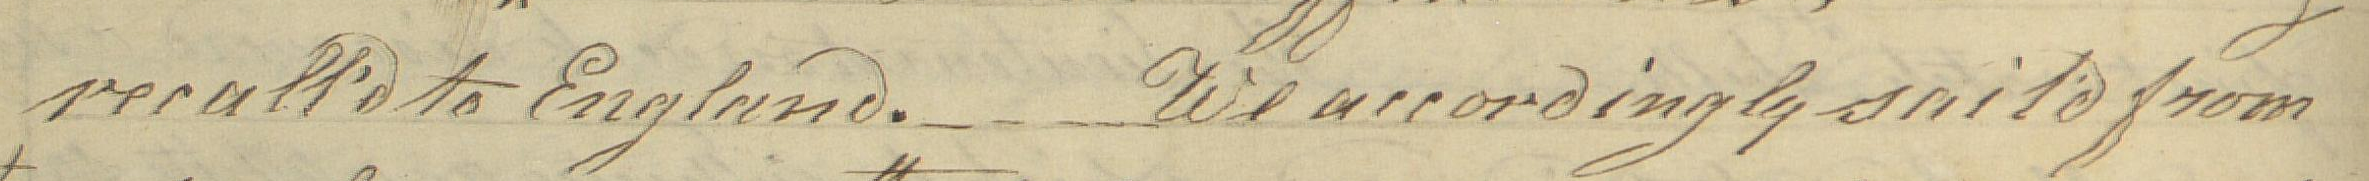recall'd to England. We accordingly sail'd from
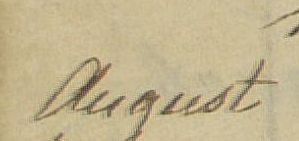August
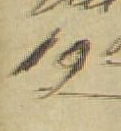19
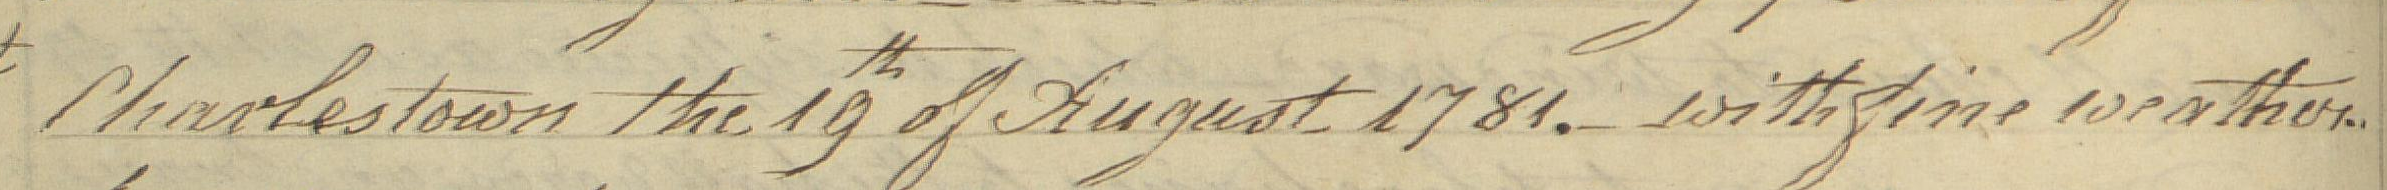Charlestown the 19^th of August 1781. with fine weather
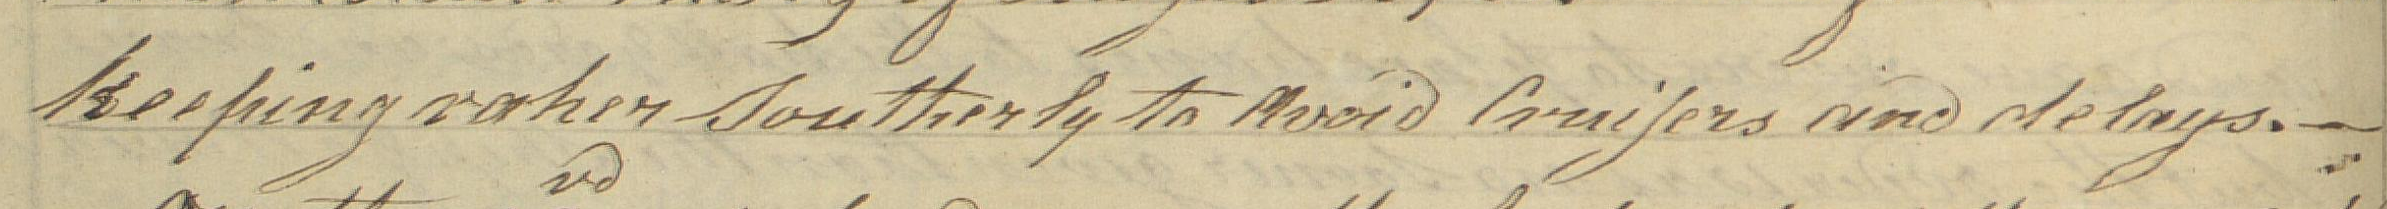keeping raher Southerly to Avoid Cruisers and delays.
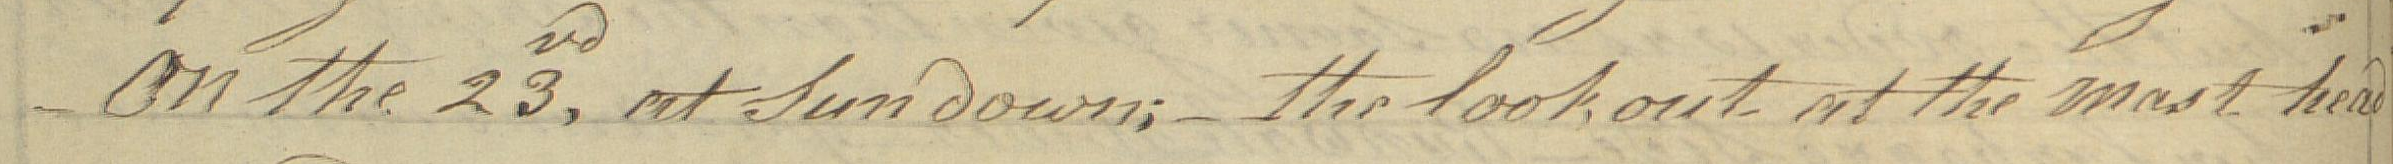On the 23^rd, at sundown; the look out at the mast head
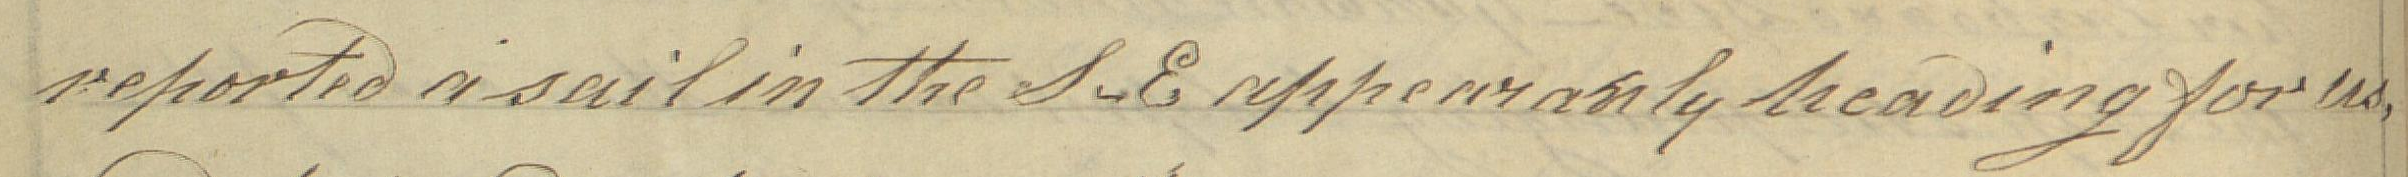reported a sail in the S.E apparently heading for us,
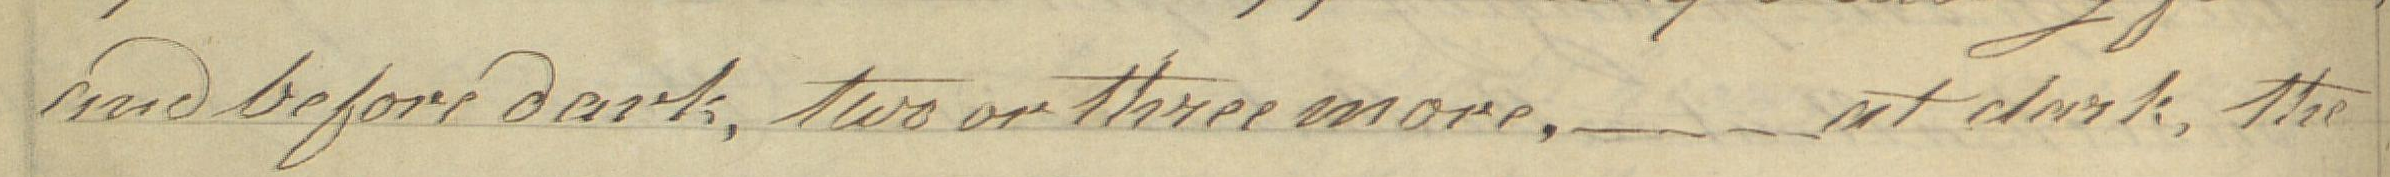and before dark, two or three more. at dark, the
